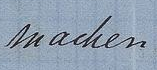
zu machen.
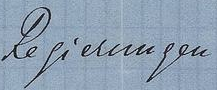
Die Instruction habe
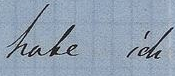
entworfen; sie
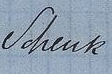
Schenk
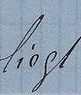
ich
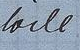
heute
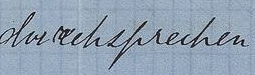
durchsprechen
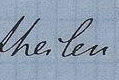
sie Ihnen
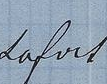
sofort
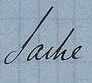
Sache
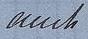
besseren
